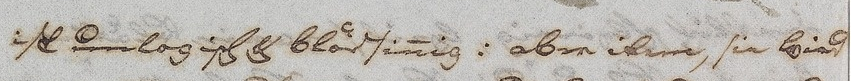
ist unlogisch & blödsinnig: aber item, sie wird
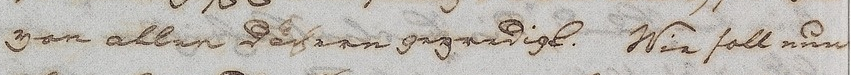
von allen Dächern gepredigt. Wie soll nun
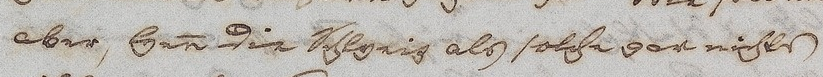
aber, wenn die Schweiz als solche gar nichts
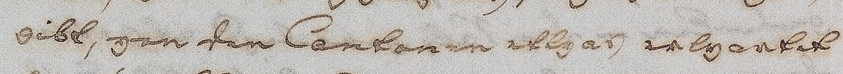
gibt, von den Cantonen etwas erwartet
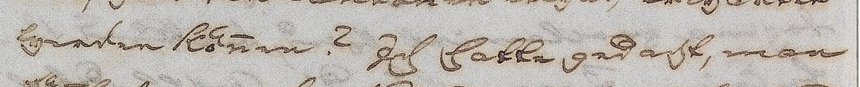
werden können? Ich hatte gedacht, man
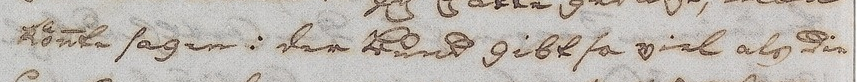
könnte sagen: der Bund gibt so viel als die
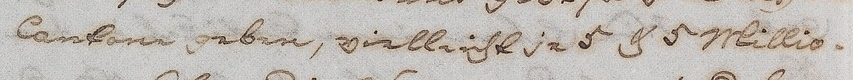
Cantone geben, vielleicht ja 5 & 5 Millio-
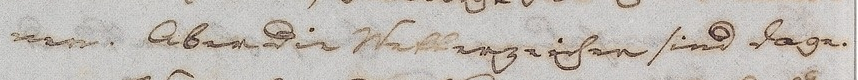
nen. Aber die Wetterzeichen sind dage-
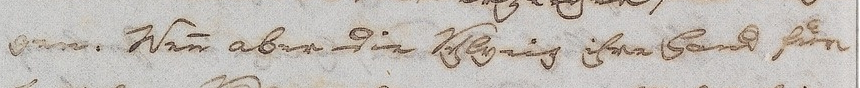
gen. Wenn aber die Schweiz ihre Hand für
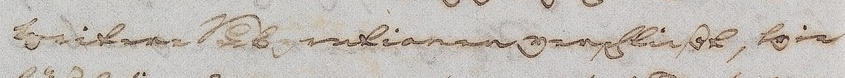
weitere Subventionen verschließt, wie
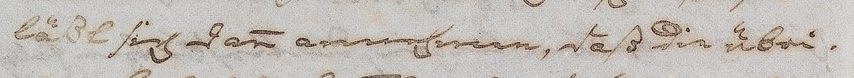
läßt sich dann annehmen, daß die übri-
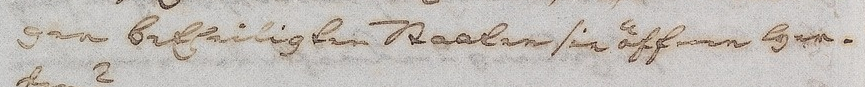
gen betheiligten Staaten sie öffnen wer-
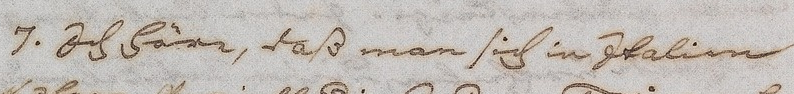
7. Ich höre, daß man sich in Italien,
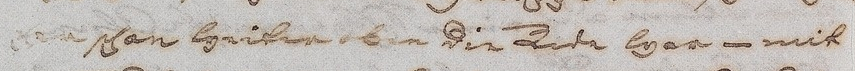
cher schon weiter oben die Rede war – mit
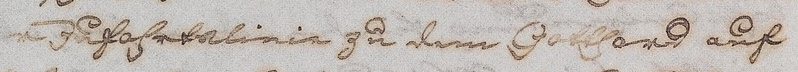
einer/der Zufahrtslinie zu dem Gotthard auf
